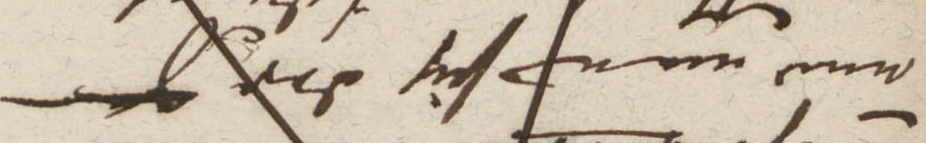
wandstickereien der Nimrud Könige
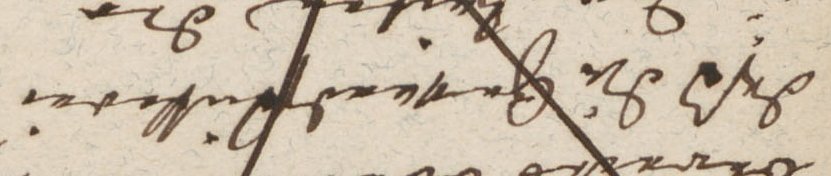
gestickten Gewändern der alten
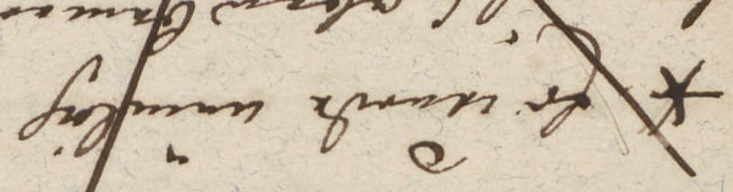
auch jener späteren Malereien;%
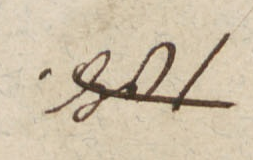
beidente.
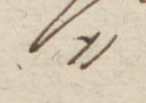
117.
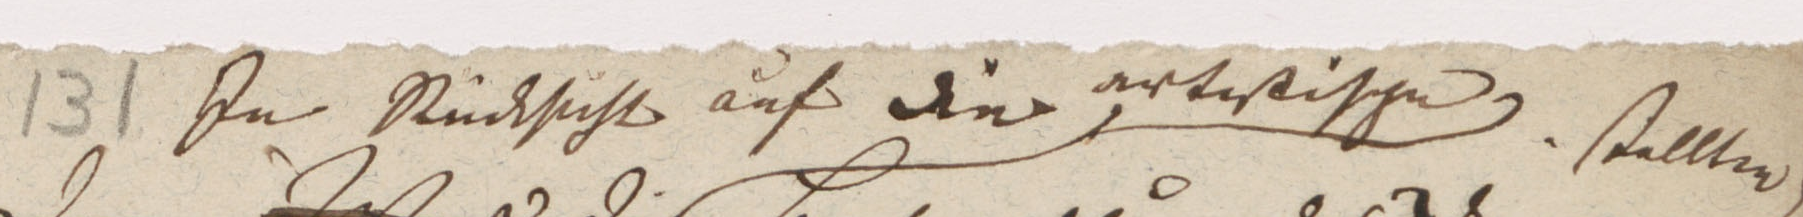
die In Rücksicht auf die artistische Behandlung
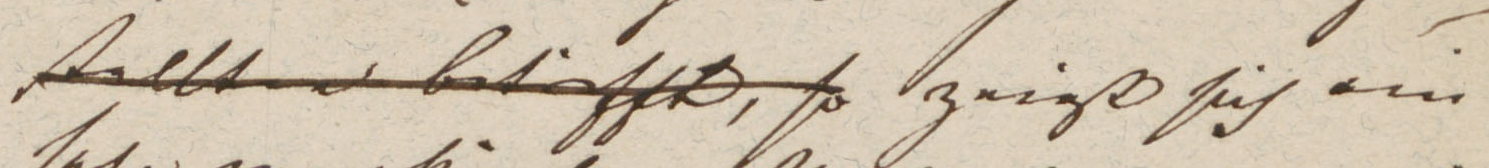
stellten betrifft, so zeigt sich ein
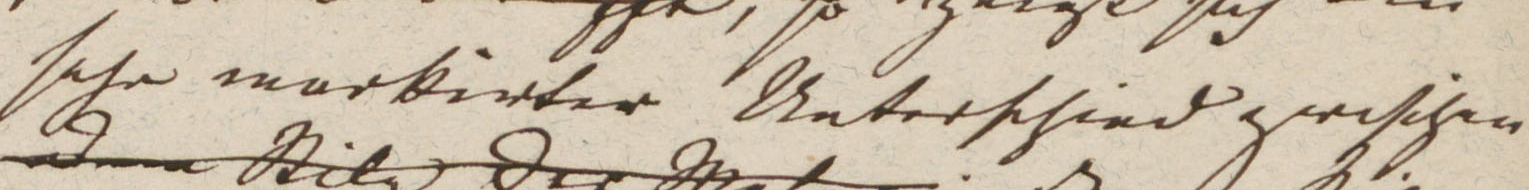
sehr markirter Unterschied zwischen
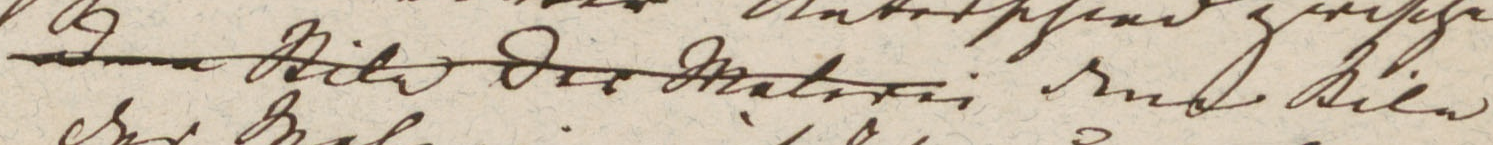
dem Stile der Malerei dem Stile
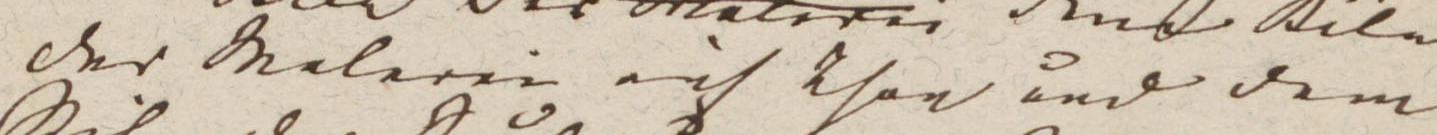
der Malerei auf Thon und dem
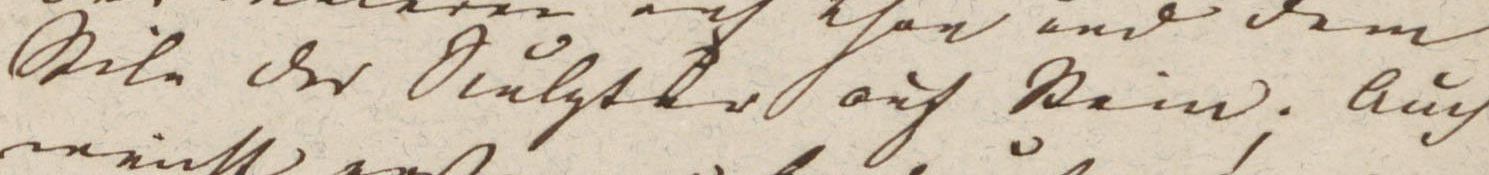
Stile der SKulptur auf Stein; Auch
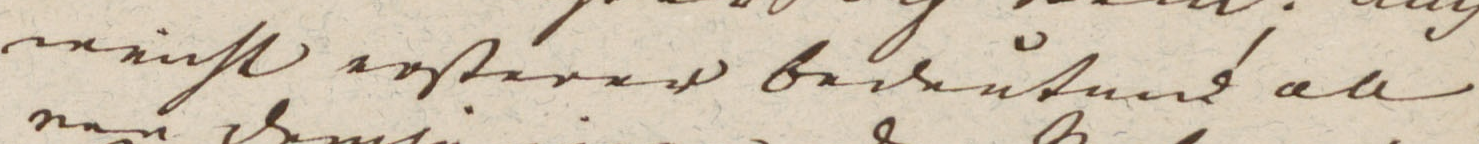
weicht ersterer bedeutend ab
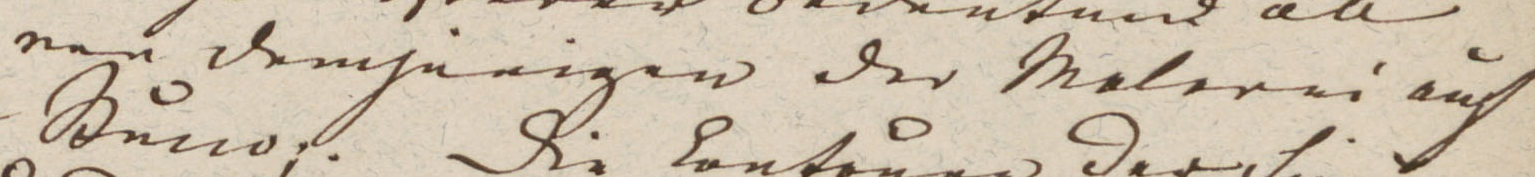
von demjenigen der Malerei auf
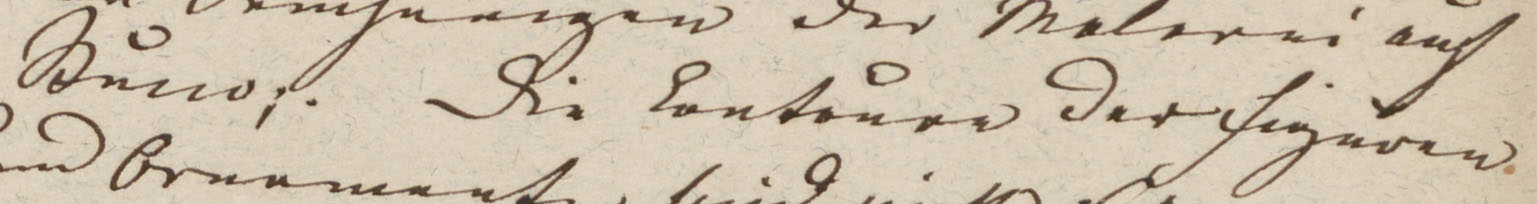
Stucco;. Die Contoure der Figuren
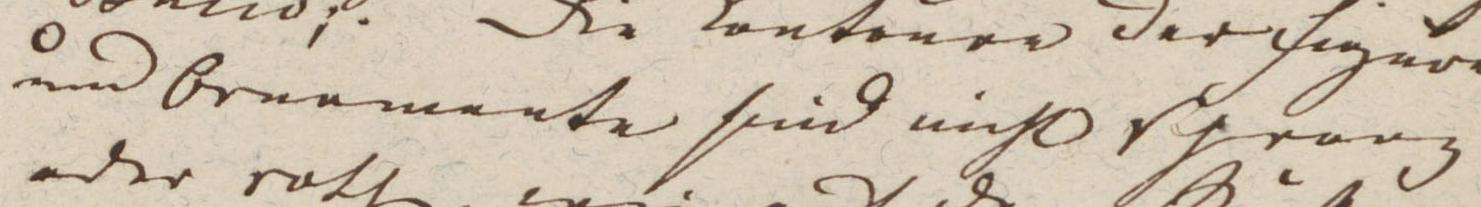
und Ornamente sind nicht schwarz
